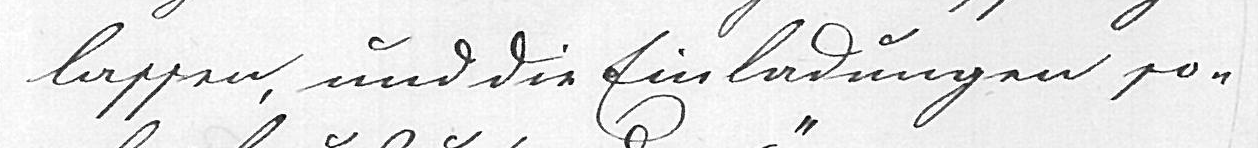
" lassen, und die Eimladungen so-
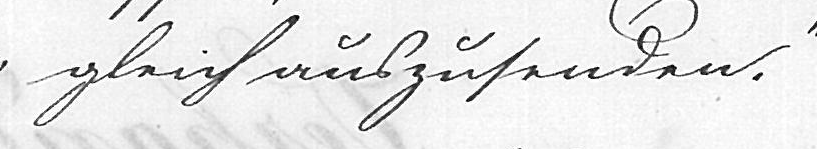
"gleich auszusenden."
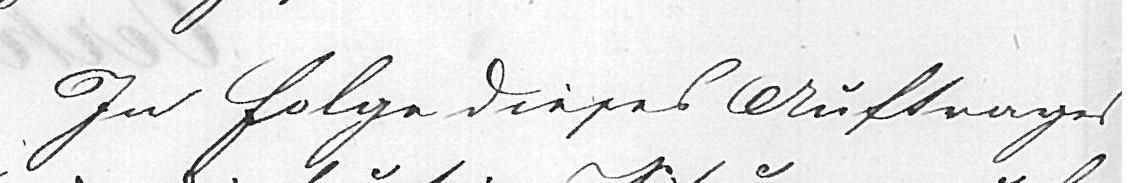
In Folge diess Auftrages
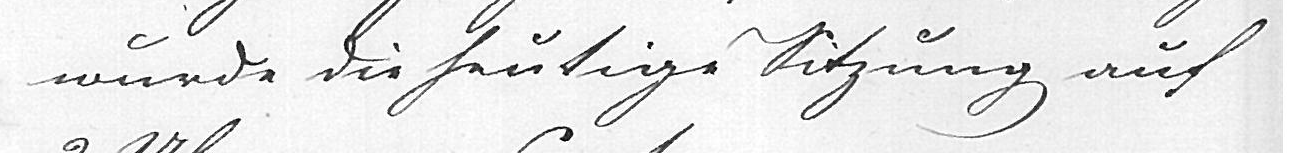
wurde die heutigen Sitzung auf
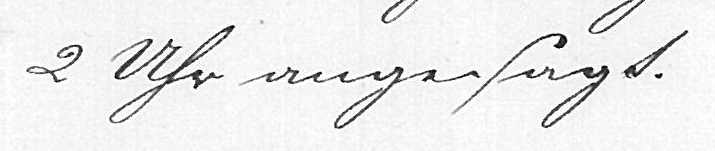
2 Uhr angesagt.
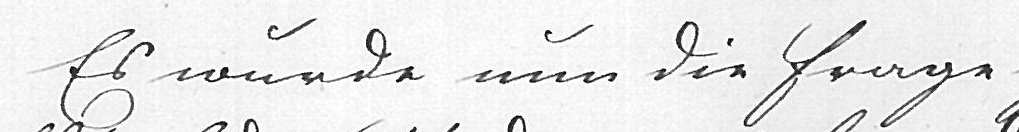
Es wurde nun die Frage ge-
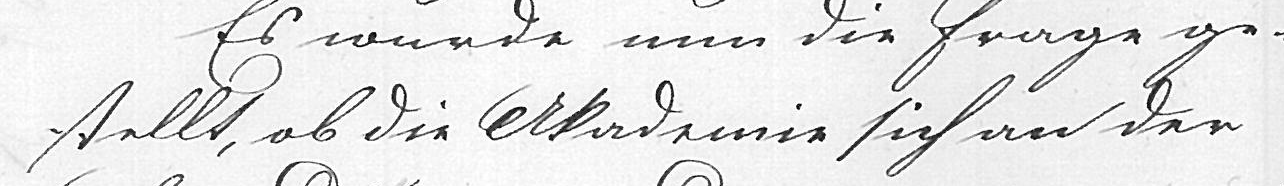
stellt, ob die Akademie sich an der
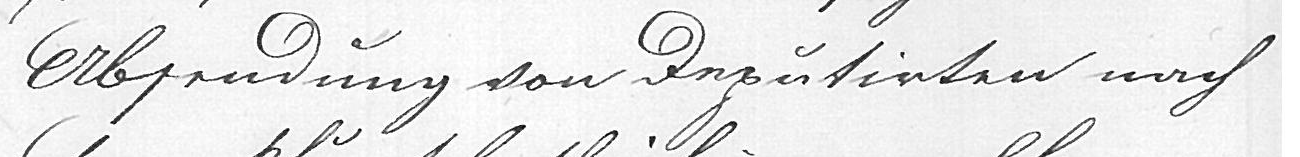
Absendung von Deputirten nach
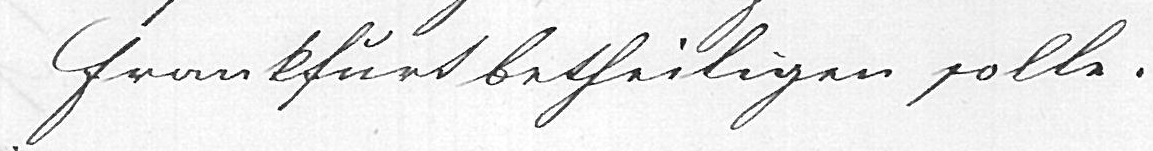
Erankfirt betheiligen solle.
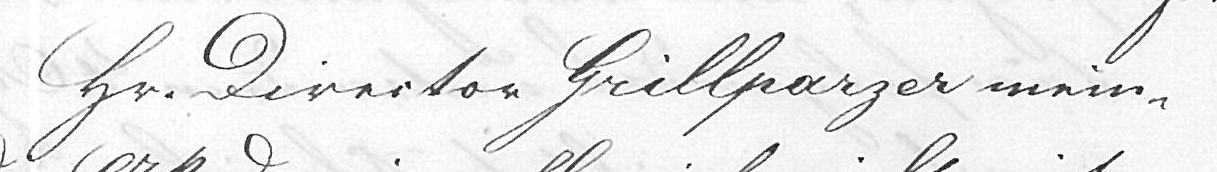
Hr. Director Grillparzer mein-
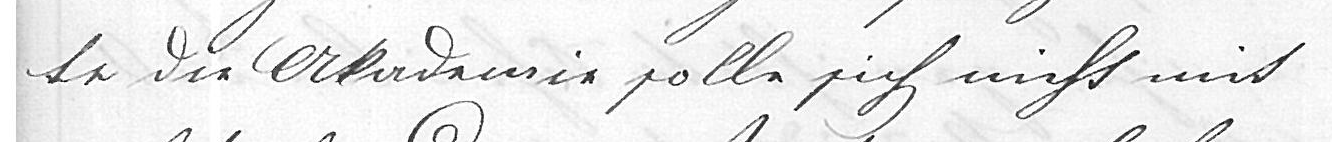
te die Akademie solle sich nicht mit
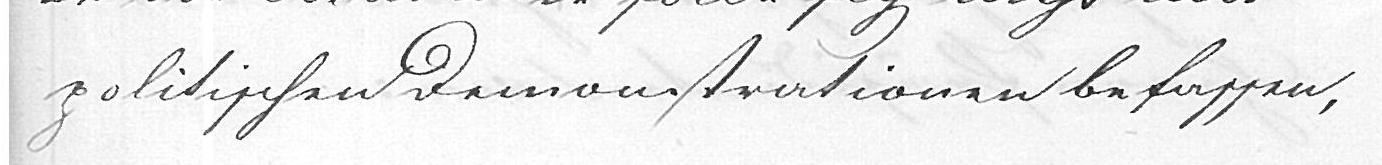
politischen Demonstrationen befassen,
